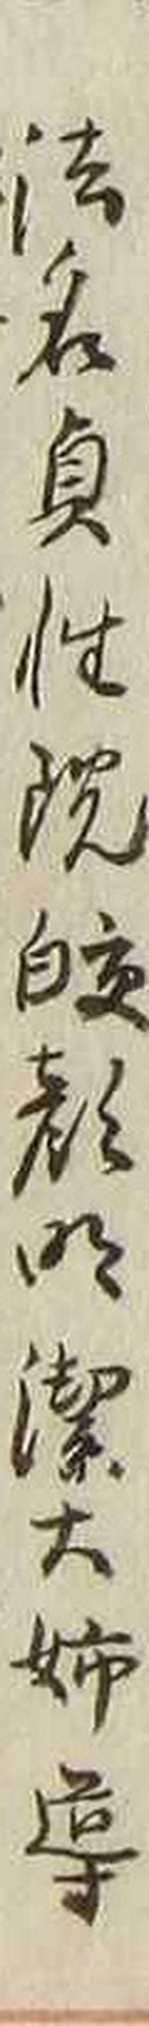法名貞性院皎顔明潔大姉導
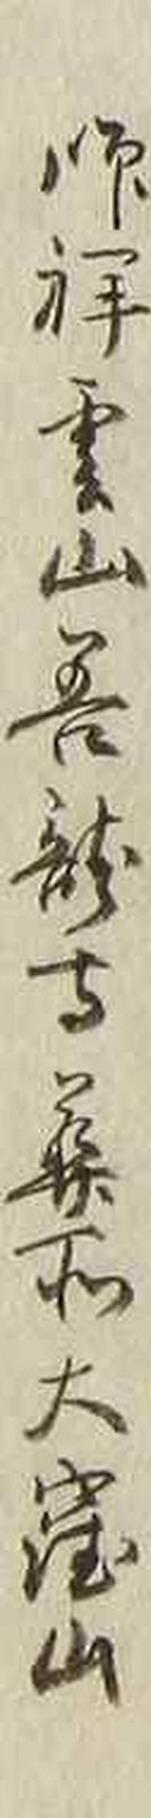師祥雲山善龍寺葬所大窪山
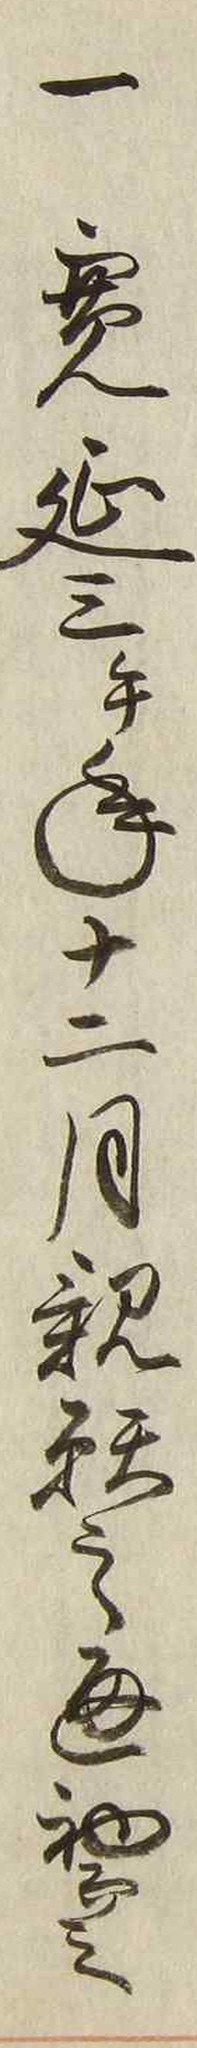一寛延三午年十二月親願之通初而之

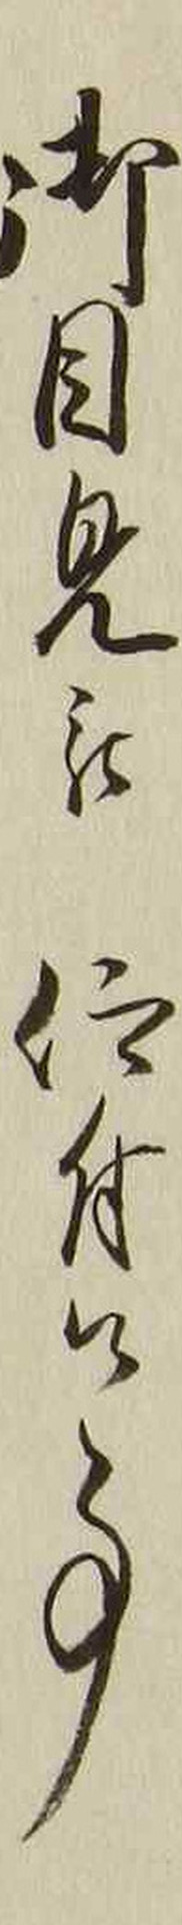御目見被仰付候事
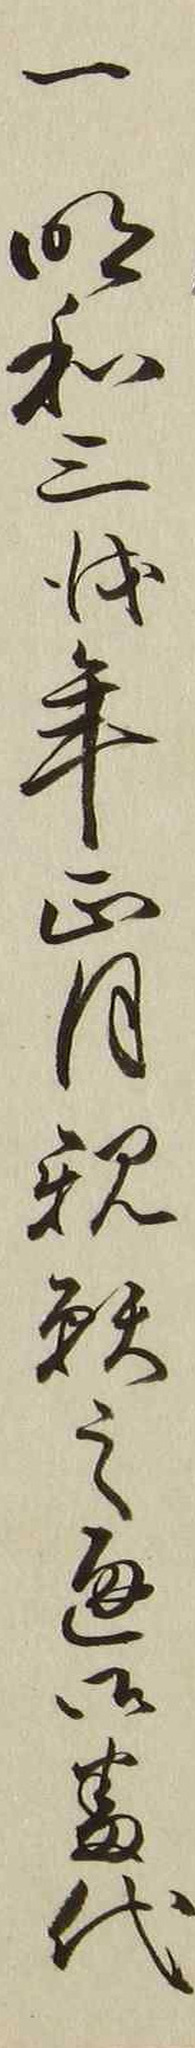一明和三戌年正月親願之通御番代
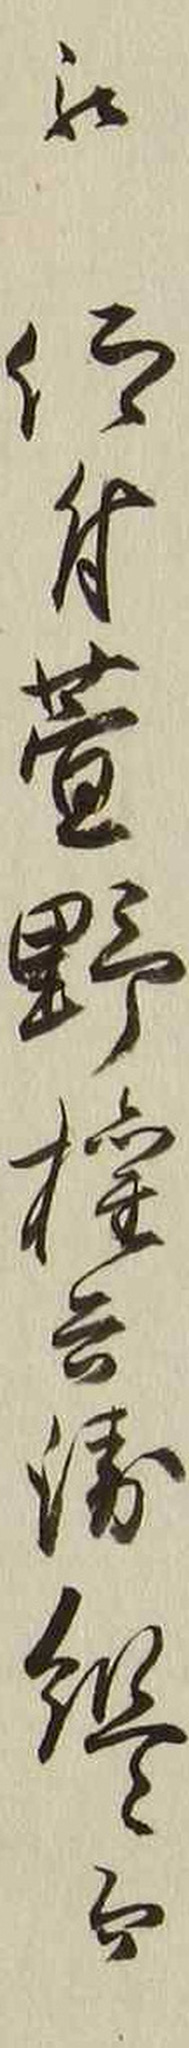被仰付萱野権兵衛組ニ而
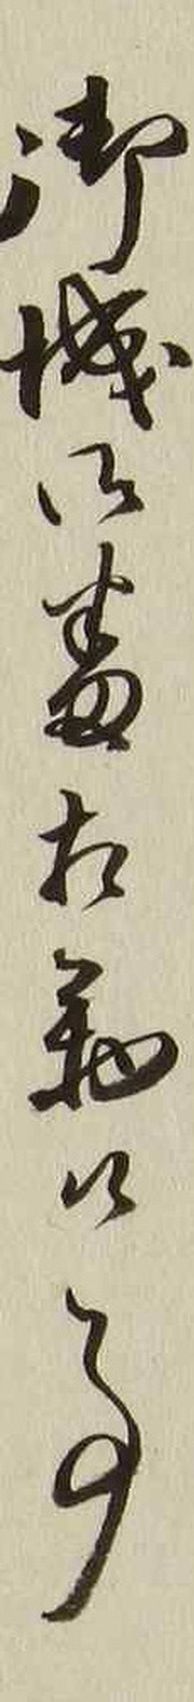御城御番相勤候事
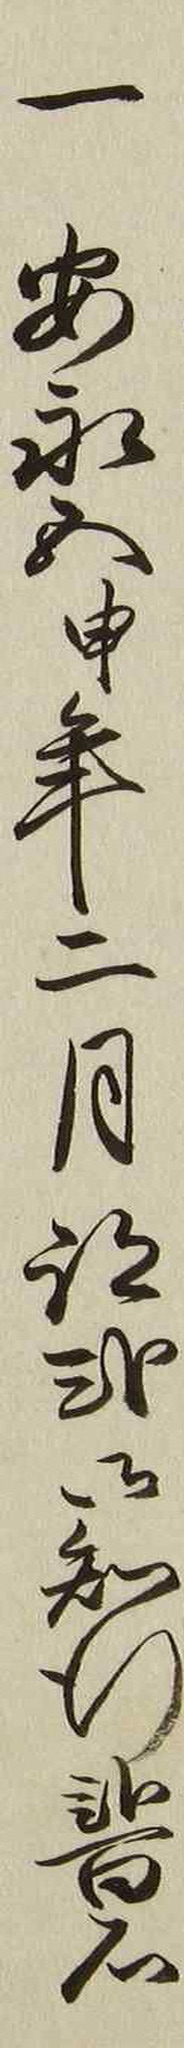一安永五申年二月跡式御知行弐百石
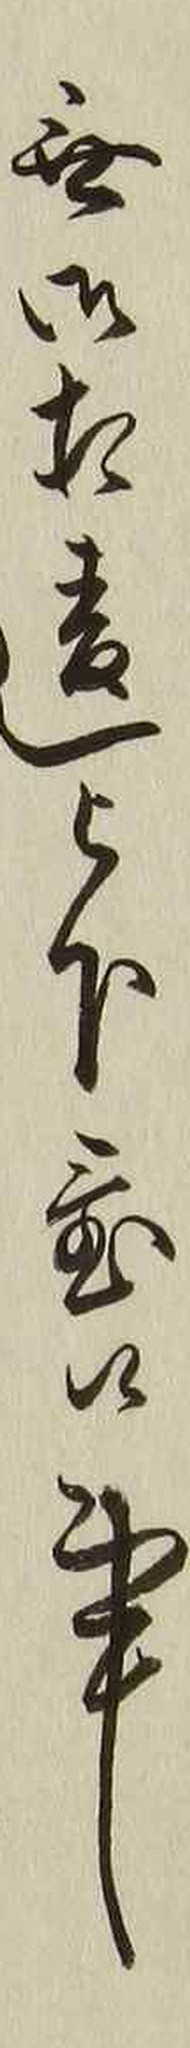無御相違被下置候事
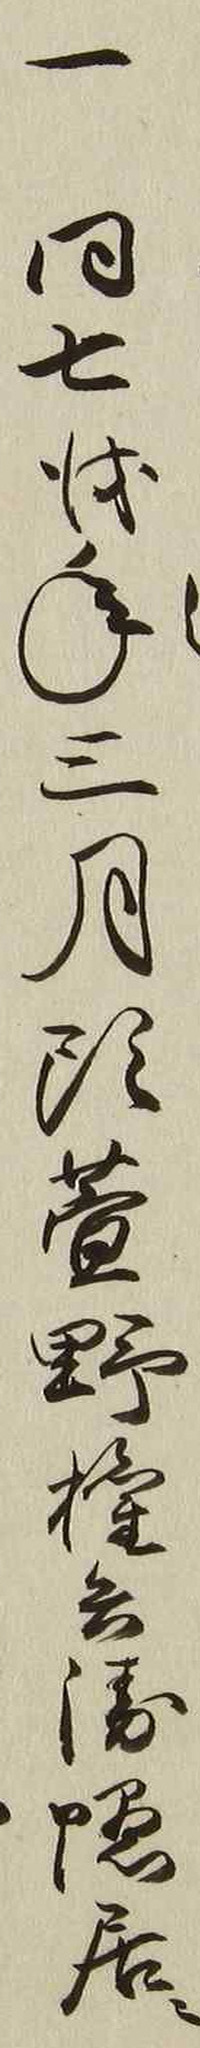一同七戌年三月頭萱野権兵衛隠居ニ
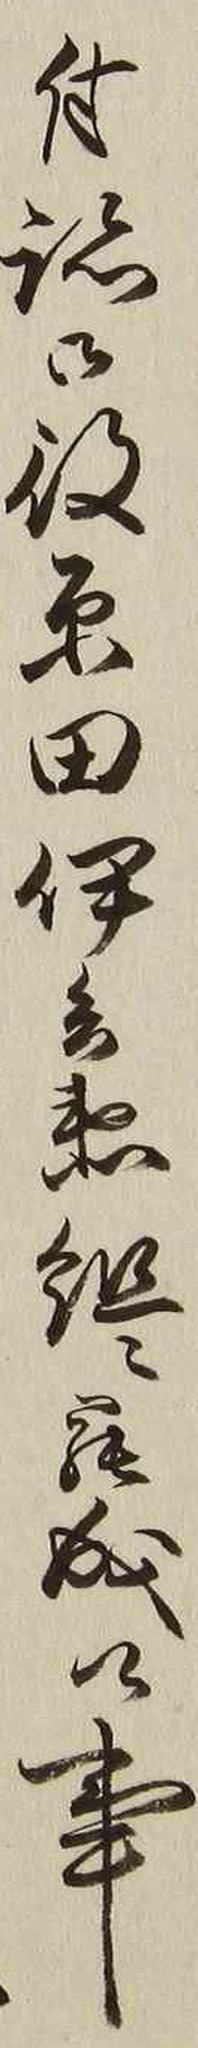付跡御役原田伊兵衛組ニ罷成候事
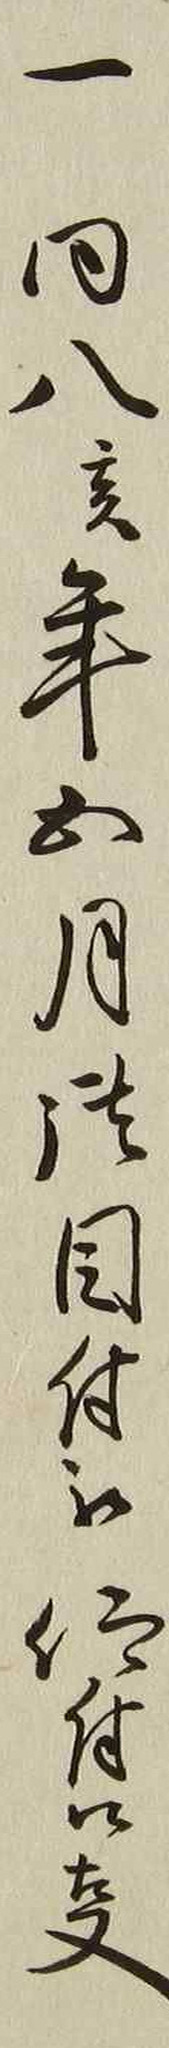一同八亥年五月御目付被仰付候事
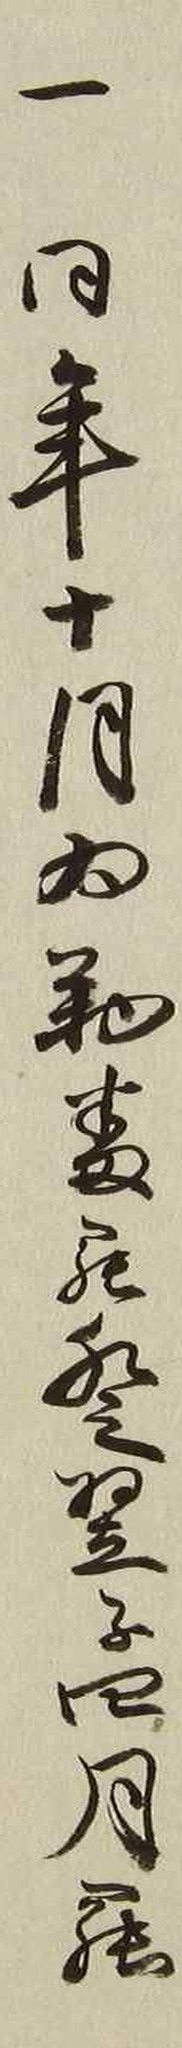一同年十月為勤番罷登翌子四月罷
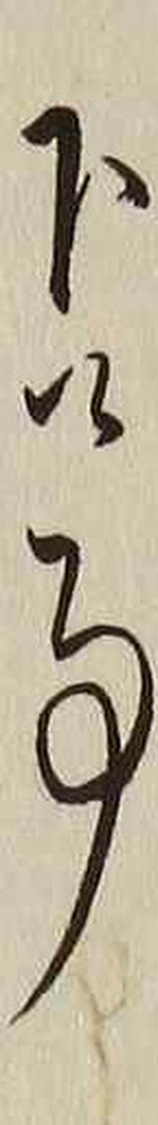下候事
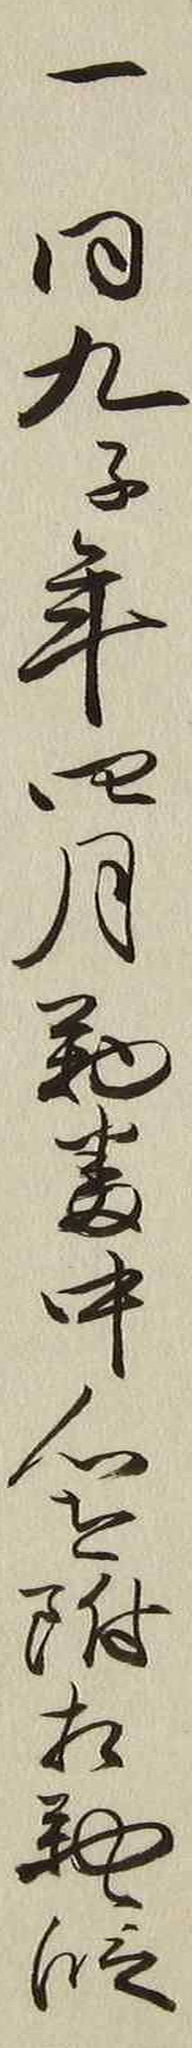一同九子年四月勤番中心を附相勤候段
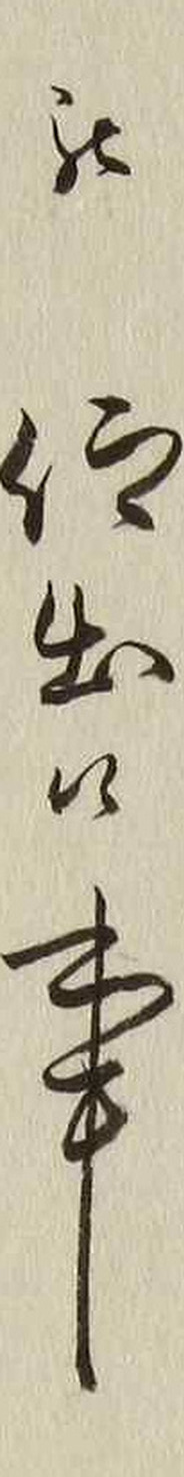被仰出候事
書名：諸士系譜　巻之21　い之部21
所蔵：会津若松市立会津図書館
